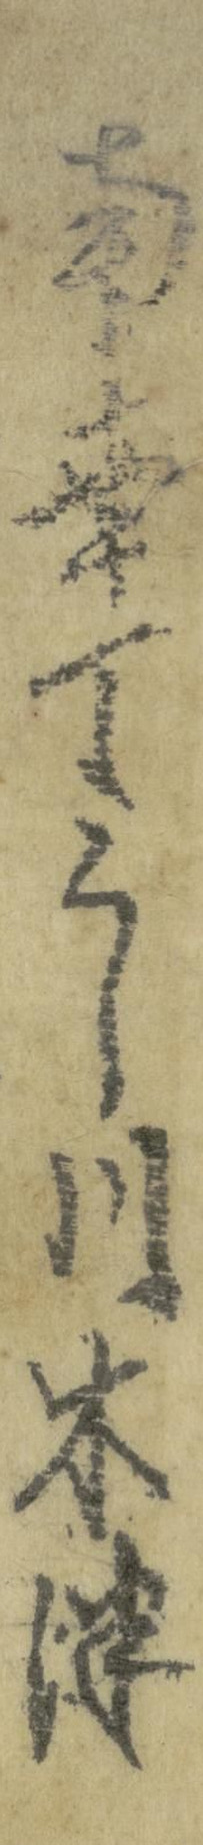南幸丁こし川木津
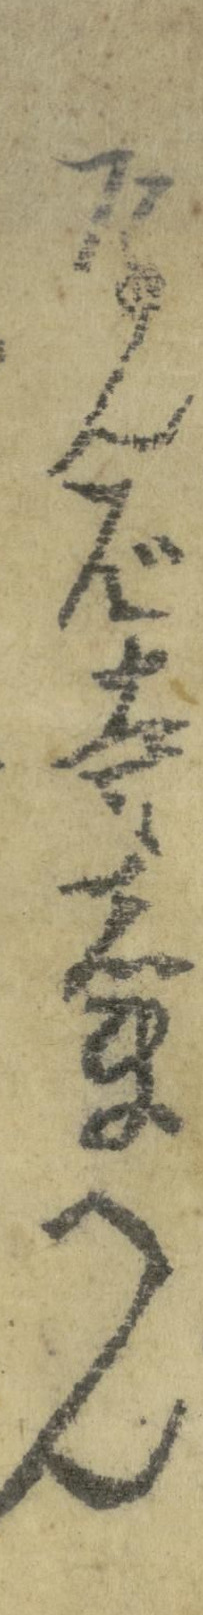なんば寺しまへん
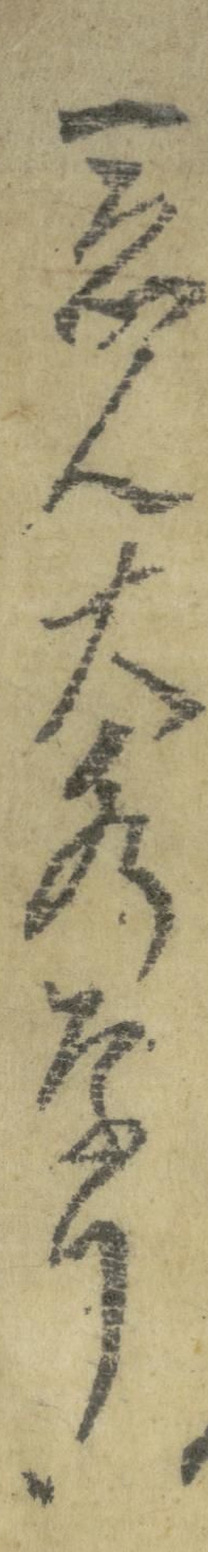一ゑん大水なり
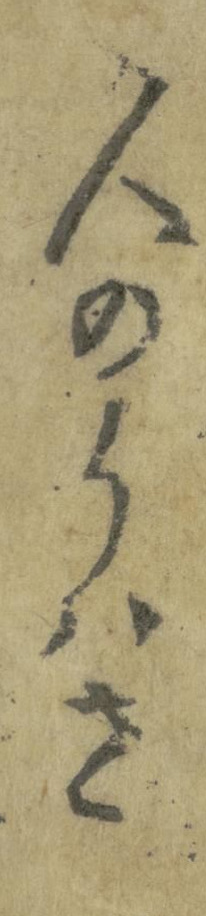人のうはさ
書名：慶応四辰五月　五畿内大水圖
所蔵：東京大学地震研究所図書室 Earthquake Research Institute Library, The University of Tokyo, JAPAN
